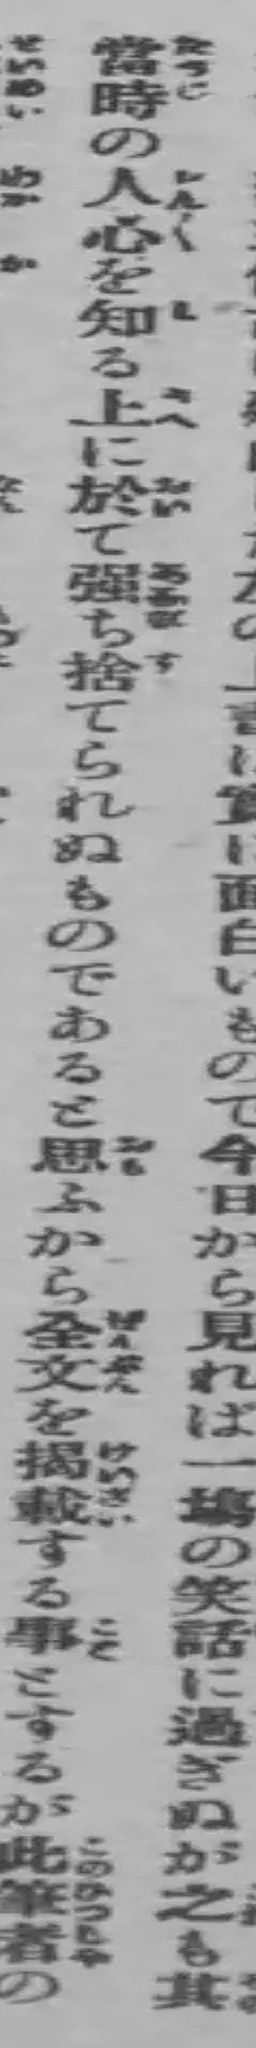当時の人心を知る上に於て強ち捨てられぬものであると思ふから全文を掲載する事とするが此筆者の
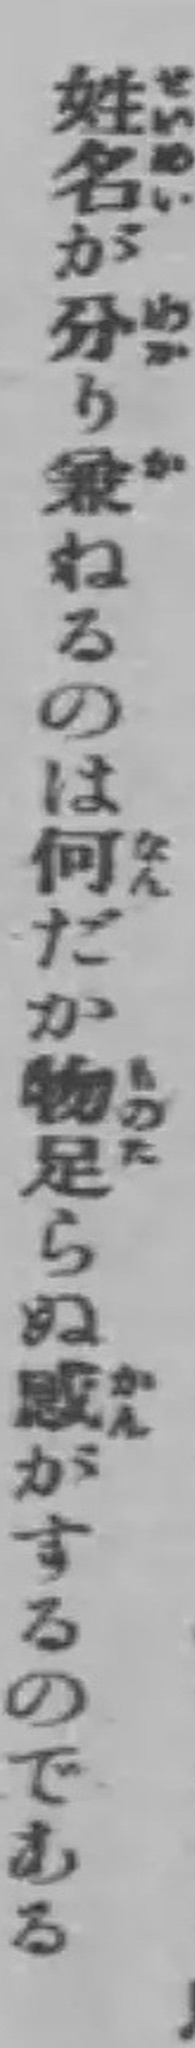姓名が分り兼ねるのは何だか物足らぬ感がするのである
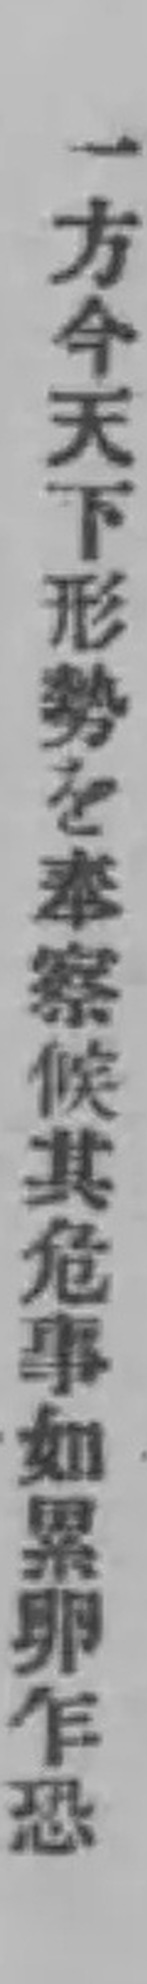一方今天下形勢を奉察候其危事如累卵乍恐
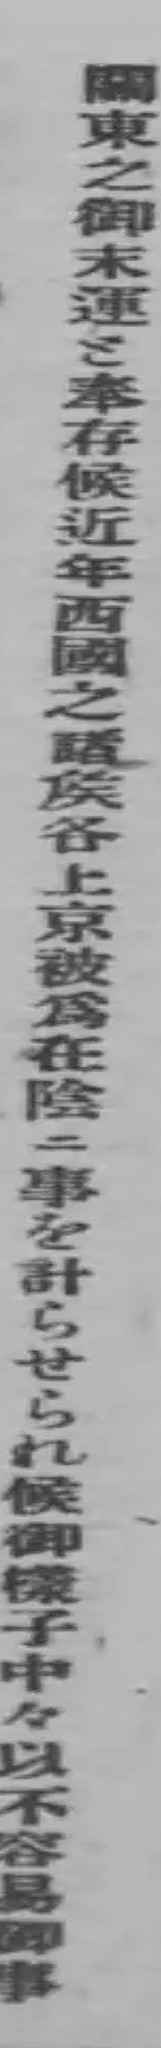関東之御末運と奉存候近年西国之諸侯各上京被為在陰ニ事を計らせられ候御様子中々以不容易御事
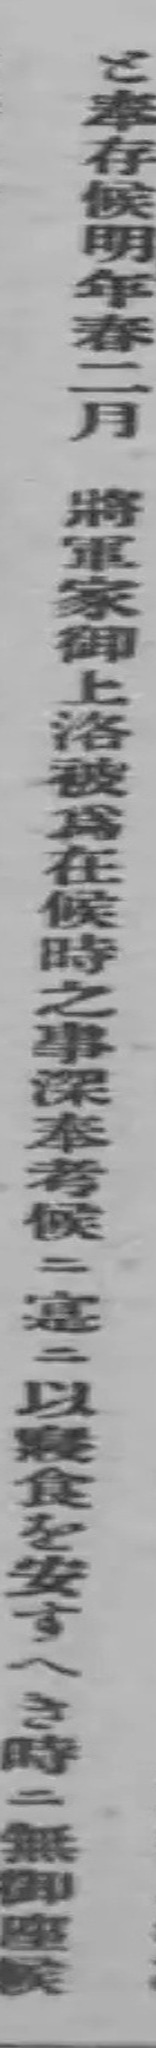と奉存候明年春二月将軍家御上洛被為在候時之事深奉考候ニ寔ニ以寝食を安すへき時ニ無御座候
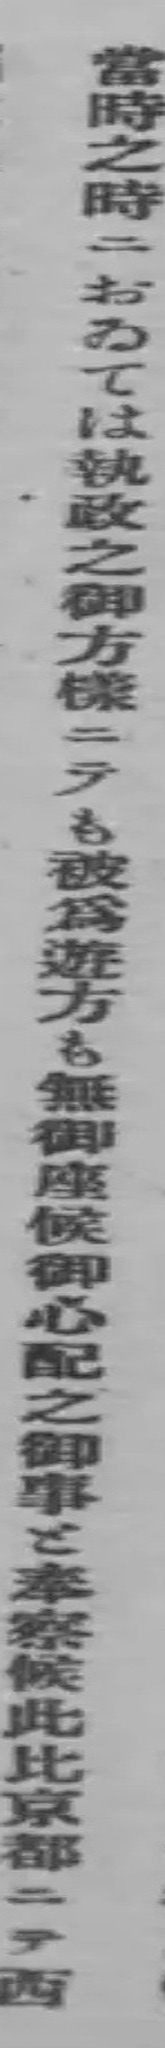当時之時ニおゐては執政之御方様ニても被為遊方も無御座候御心配之御事と奉察候此比京
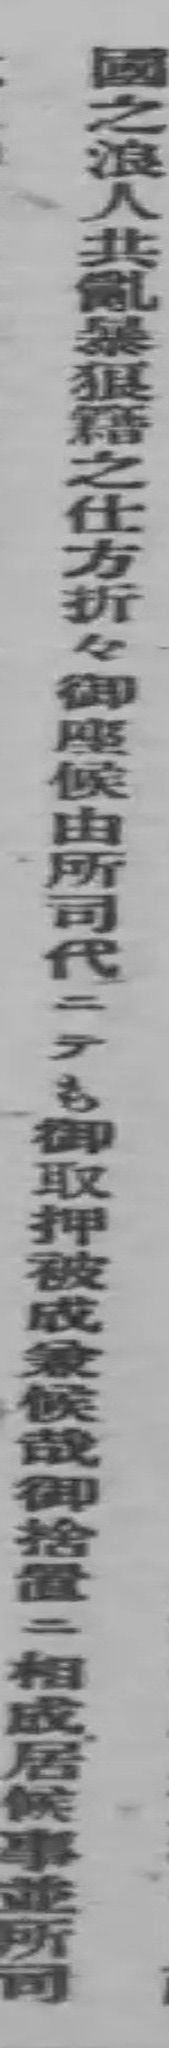国之浪人共乱暴狼藉之仕方折々御座候由所司代ニても御取押被成兼候哉御捨置ニ相成居候事並所司
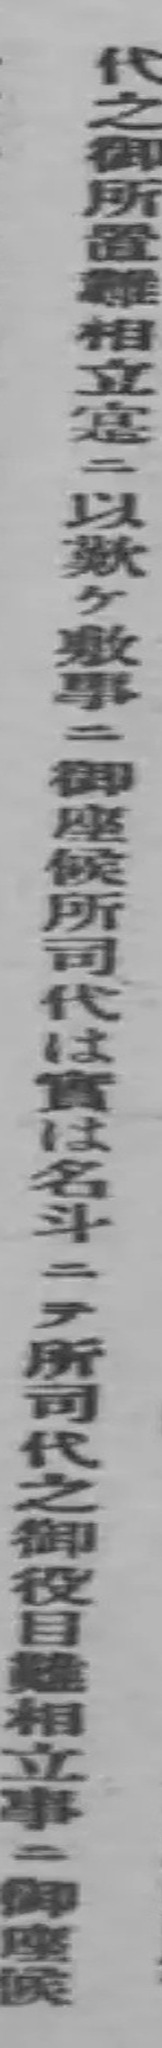代之御所置難相立寔ニ以歎ケ敷事ニ御座候所司代は実は名斗ニて所司代御役目難相立事ニ御座候
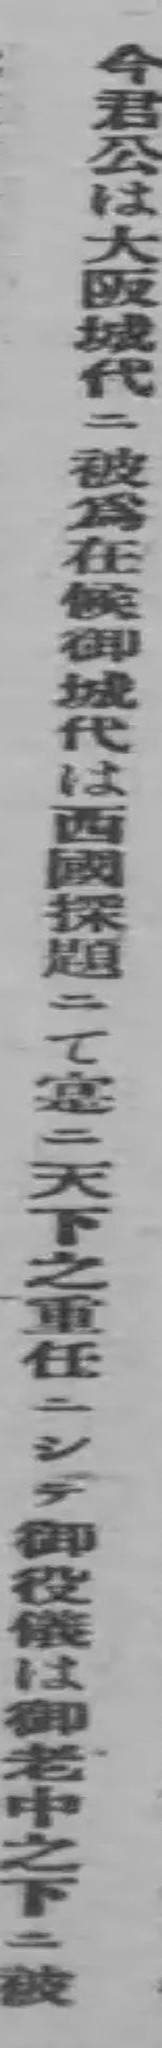今君公は大阪城代ニ被為在候御城代は西国探題ニて寔ニ天下重任ニして御役儀は御老中之下ニ被
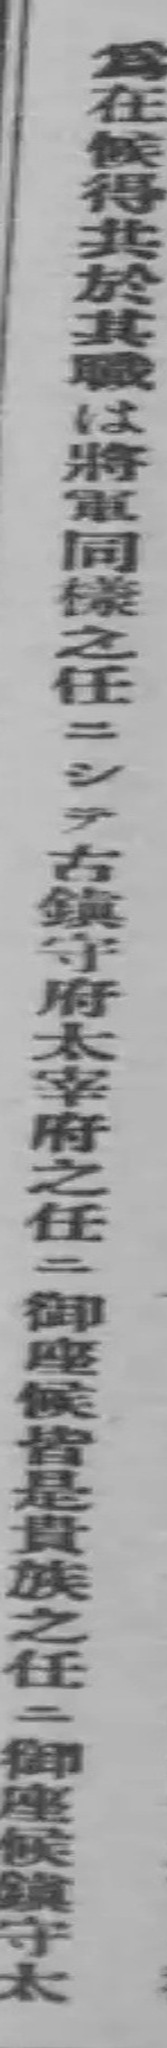為在候得共於其職は将軍同様之任ニして古鎮守府太宰府之任ニ御座候皆是貴族之任ニ御座候鎮守太
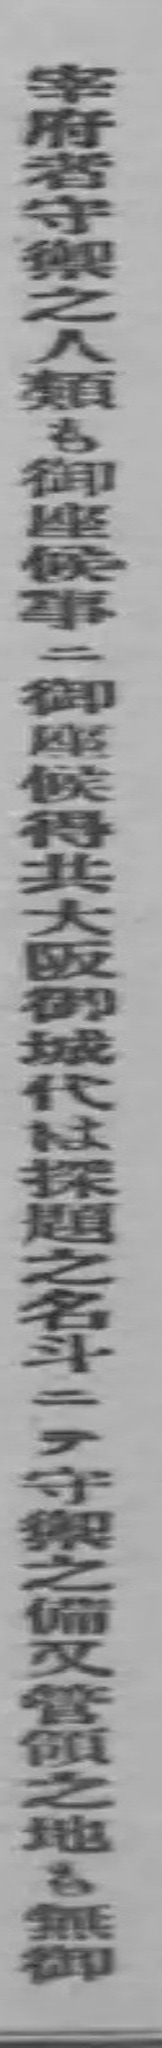宰府者守禦之人類も御座候事ニ御座候得共大阪御城代は探題之名斗ニて守禦之備又管領之地も無御
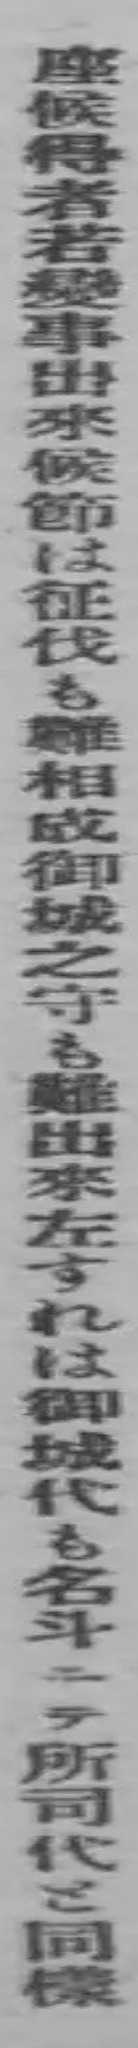座候得者若変事出来候節は征伐も難相成御城代守も難出来左すれは御城代も名斗ニて所司代と同様
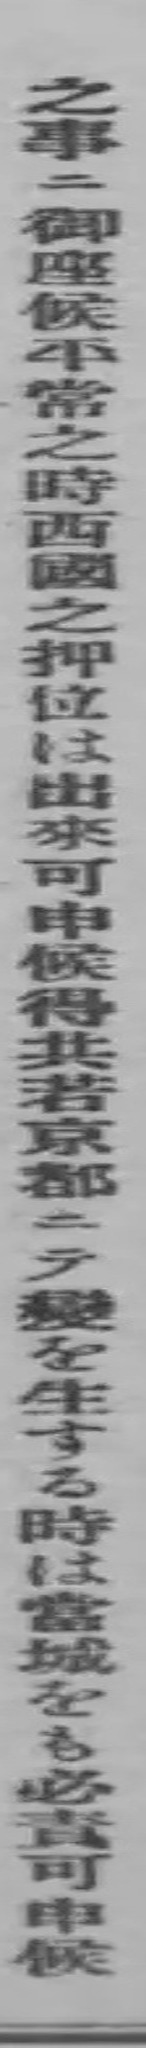之事ニ御座候平常之時西国之押位は出来可申候得共若京都ニて変を生する時は当城をも必責可申候
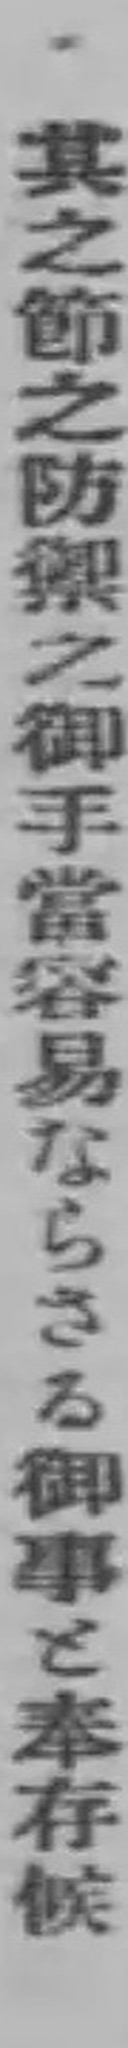其之節之防禦之御手当容易ならさる御事と奉存候
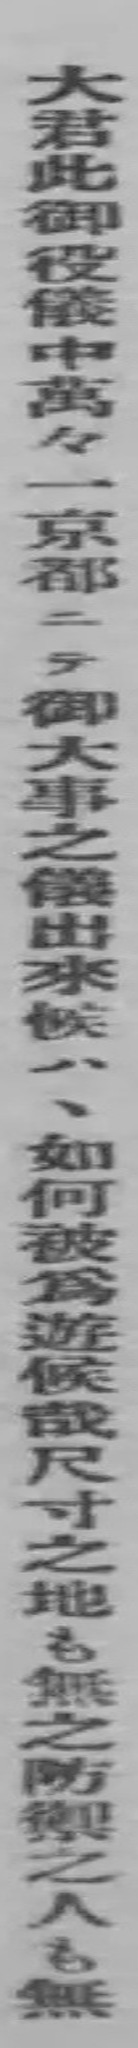大君此御役儀中万々一京都ニて御大事之儀出来候はゝ如何被為遊候哉尺寸之地も無之防禦之人も無
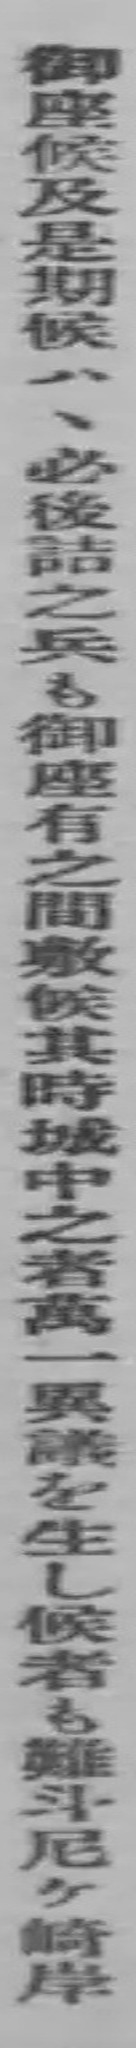御座候及是期候はゝ必後詰之兵も御座有之間敷候其時城中之者万一異議を生し候者も難斗尼ケ崎岸
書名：豊橋市史談
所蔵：国立国会図書館 National Diet Library, JAPAN
